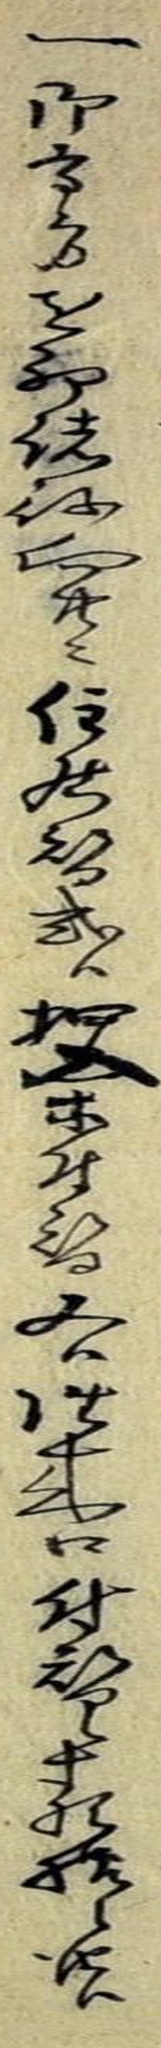一御寺方を初諸役向共に住居替或は押入等付替又は往来口付替之類繕之儀は
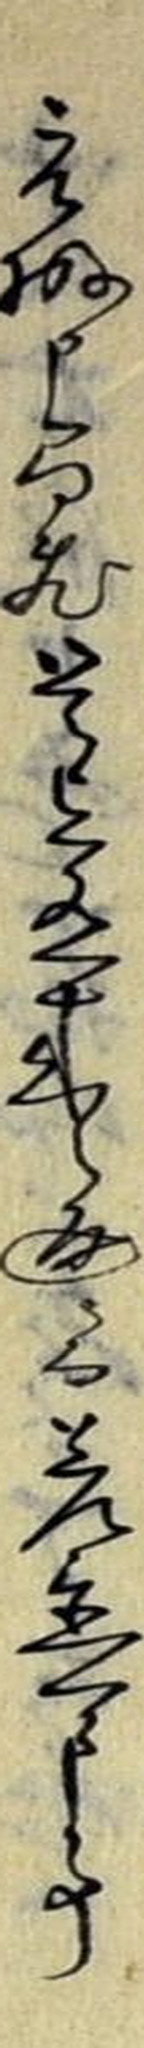取扱申間敷是迄有来候通に而差置可申事
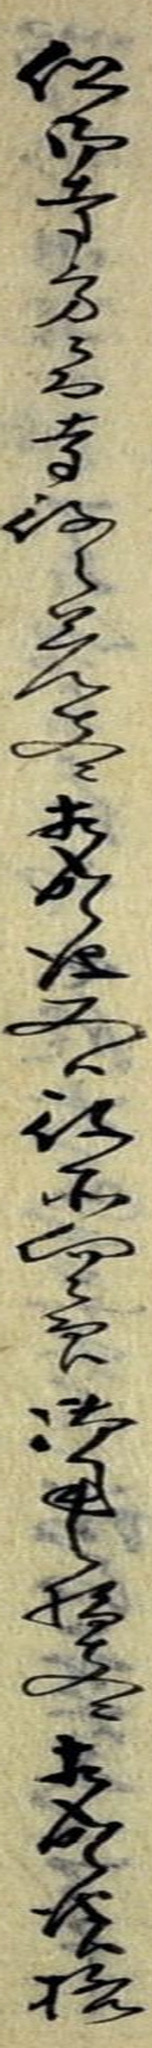但御寺方に而寺役之差支に相成候儀又は役所向に而は御用之指支に相成候儀は格
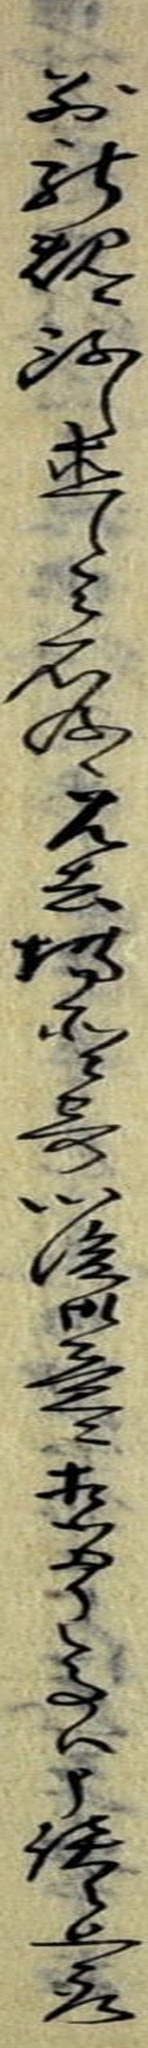別新規に致直しに不及候乍去場所に寄以後御益に相当り候候事は申談之上取
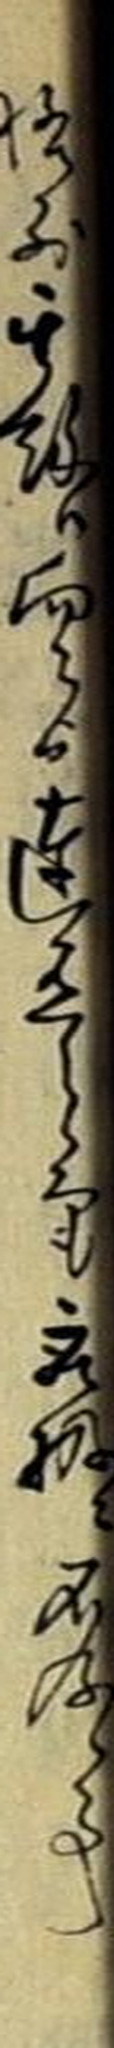格別其餘は向々ゟ達有之而も取扱に不及候事
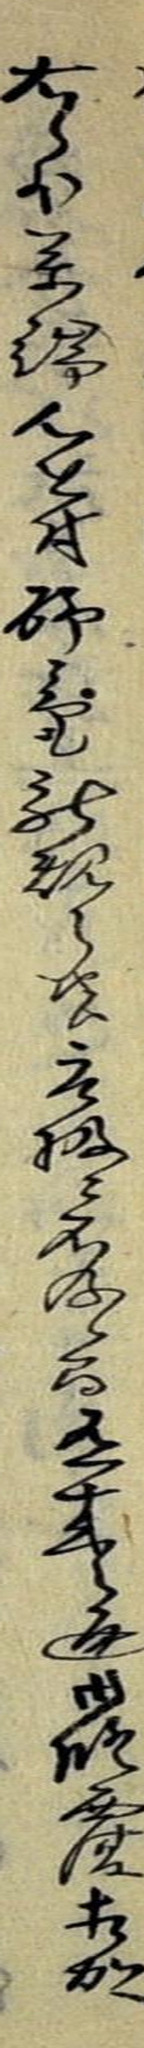右之外万端心を付聊に而も新規之儀は取扱に不及候間有来候通御修覆相
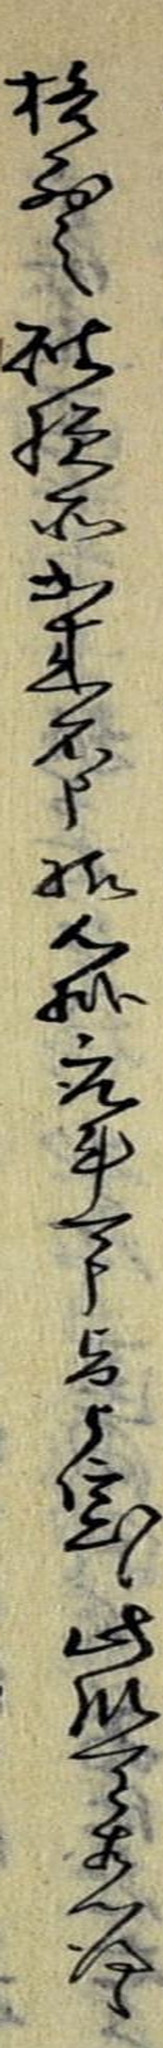格別之破損所出来不申様心掛取斗可申旨被仰出候此段可被相心得候
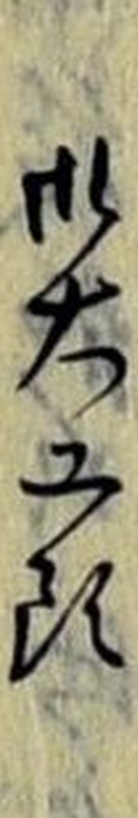御大工頭
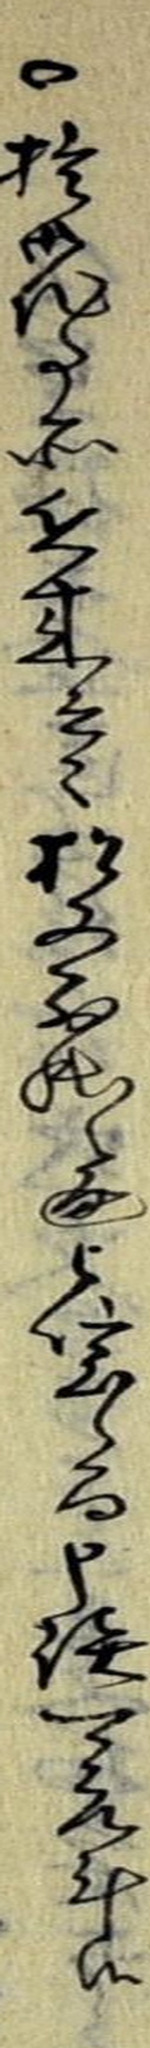○於御作事所近来云々猶又別紙之通被仰出候間申談可取斗候
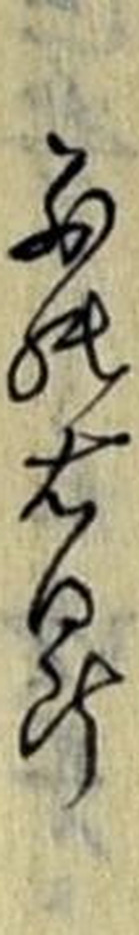別紙右同断
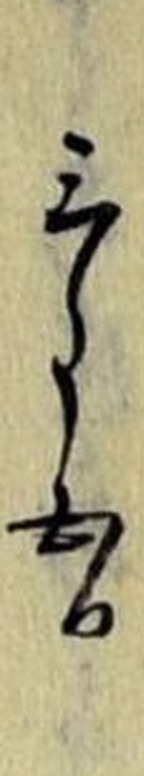三月五日
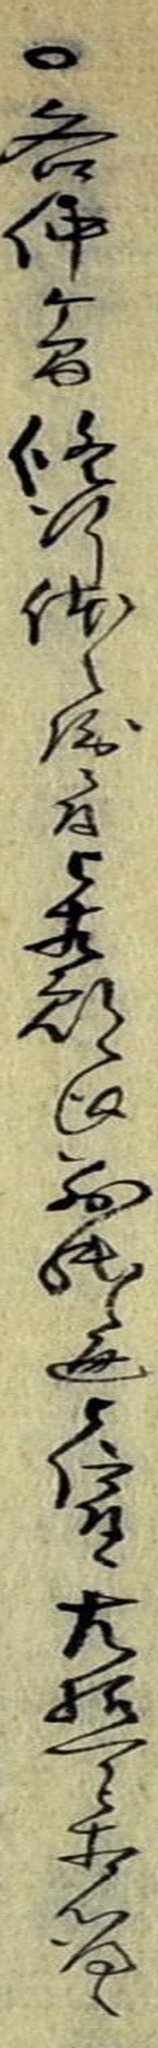○各仲ヶ間修行体之儀に付被相願候趣別紙之通被仰付候左様可被相心得候
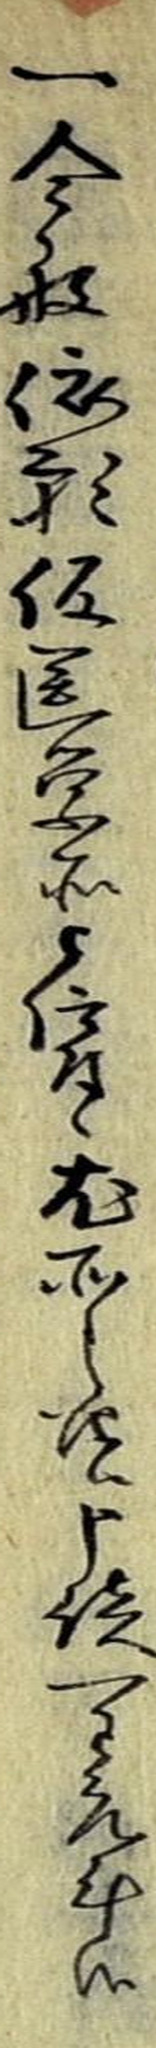一今般依願仮医学所被仰付候尤所之儀は申談可被取斗候
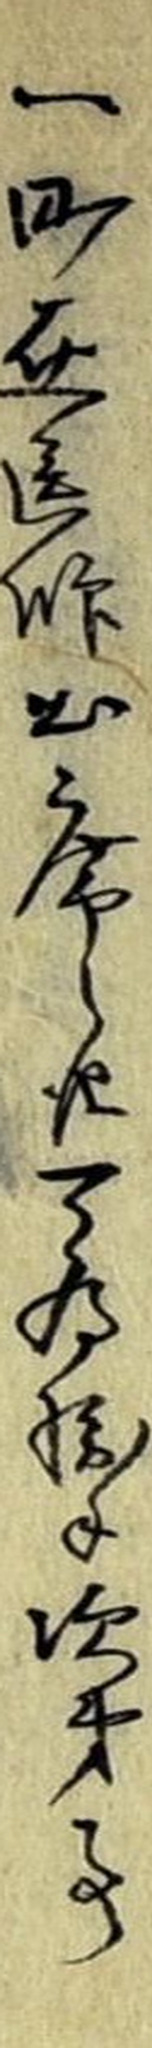一町在医師出席之儀可為勝手次第事
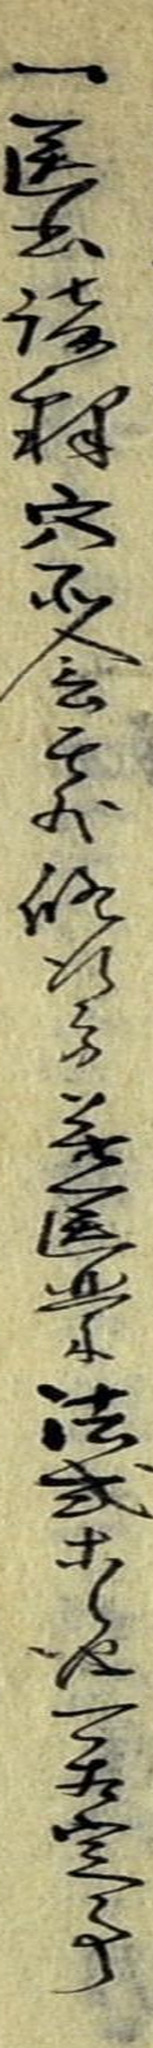一医書講釈穴所会其外修行方并医業法式等之儀可相定事
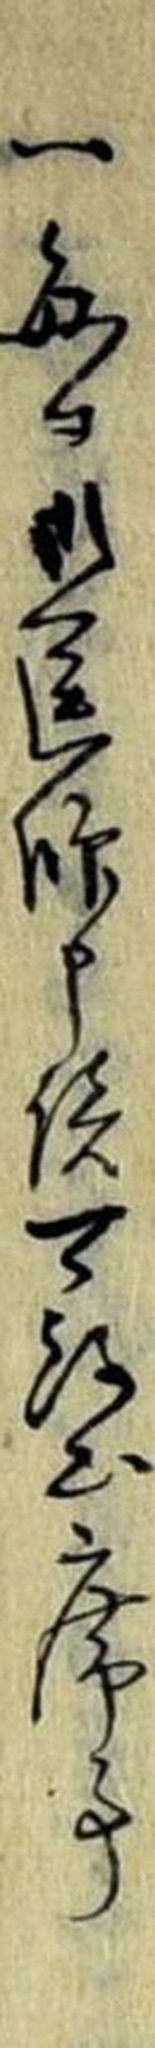一毎日御医師申談可致出席事
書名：命令之部 四
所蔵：福井県文書館 Fukui Prefectural Archives
